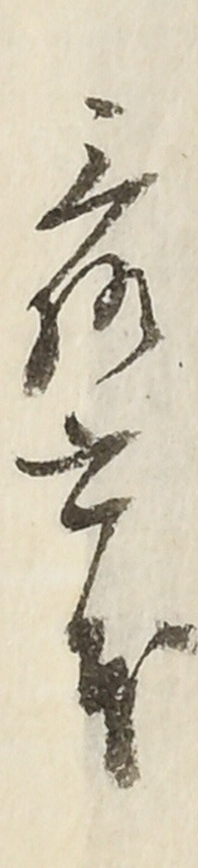三拾六本
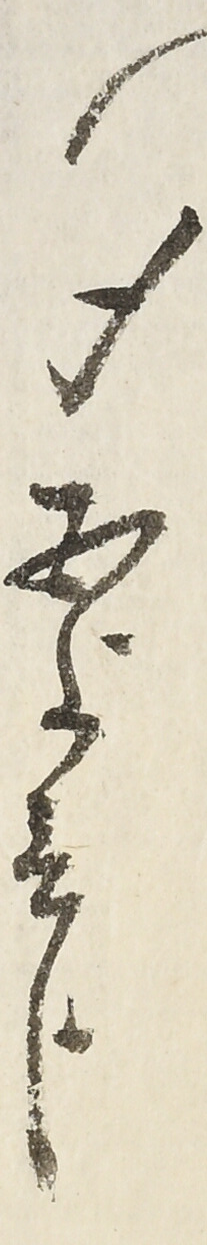〆五匁壱分
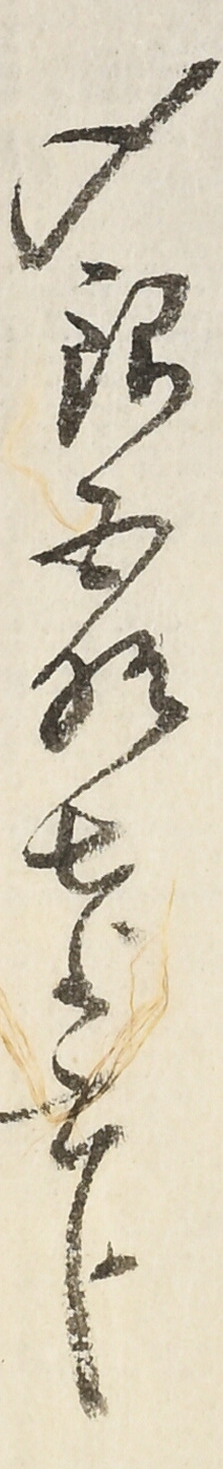〆銀五拾七匁六分
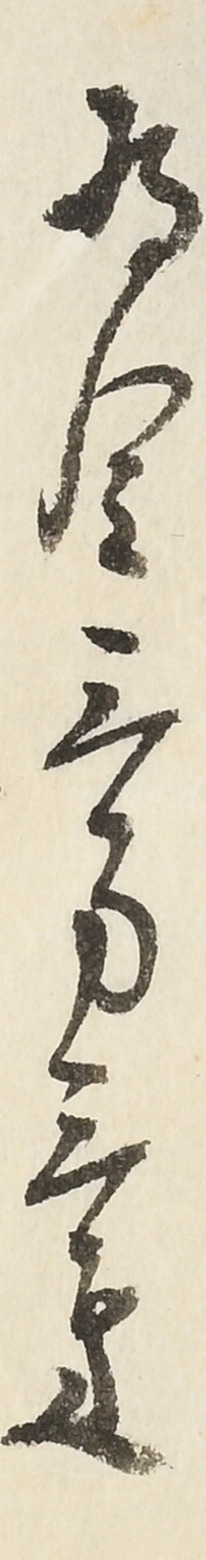為金三分三朱
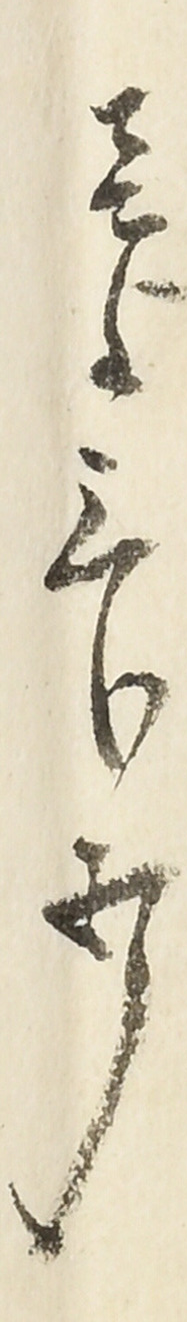壱匁三分五厘
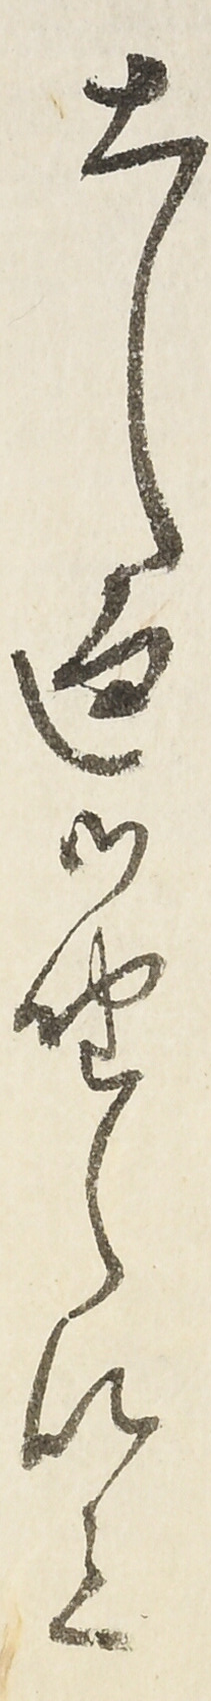右之通御届候以上
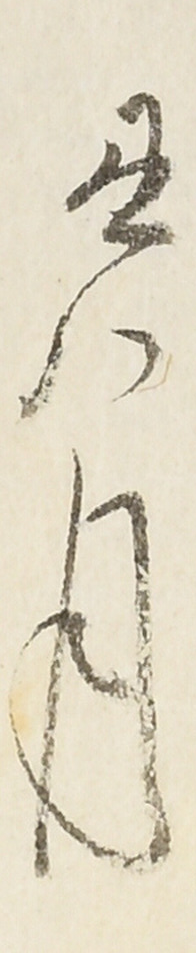丑八月
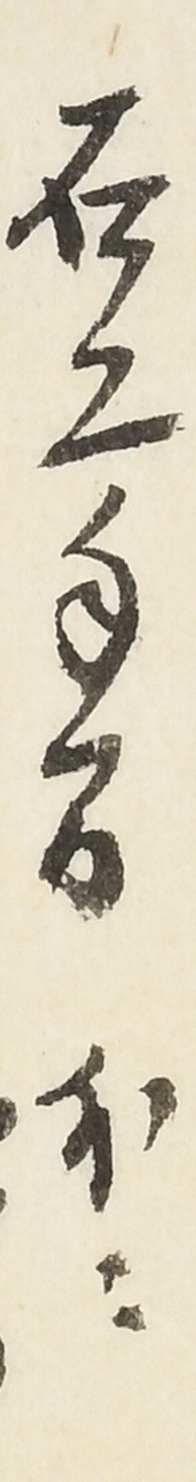石工手間外ニ
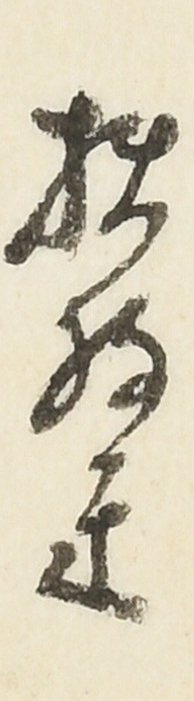扶持米
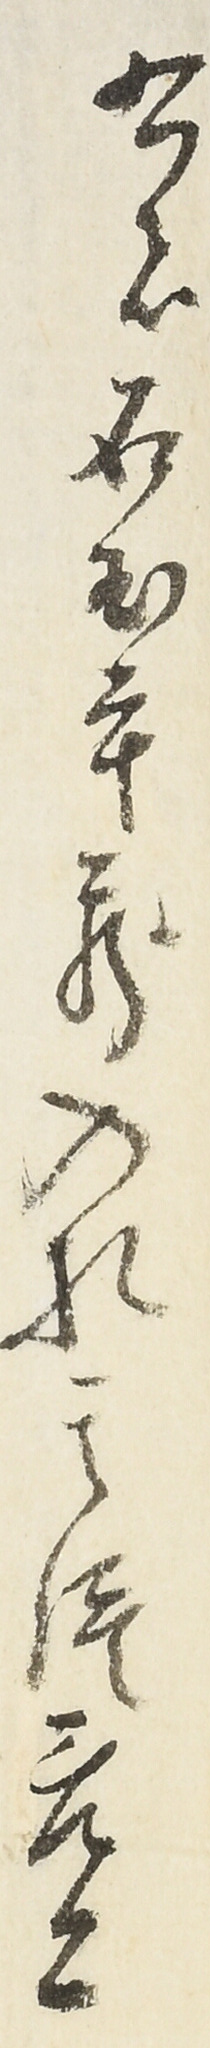右者石屋平蔵入札之侭差上
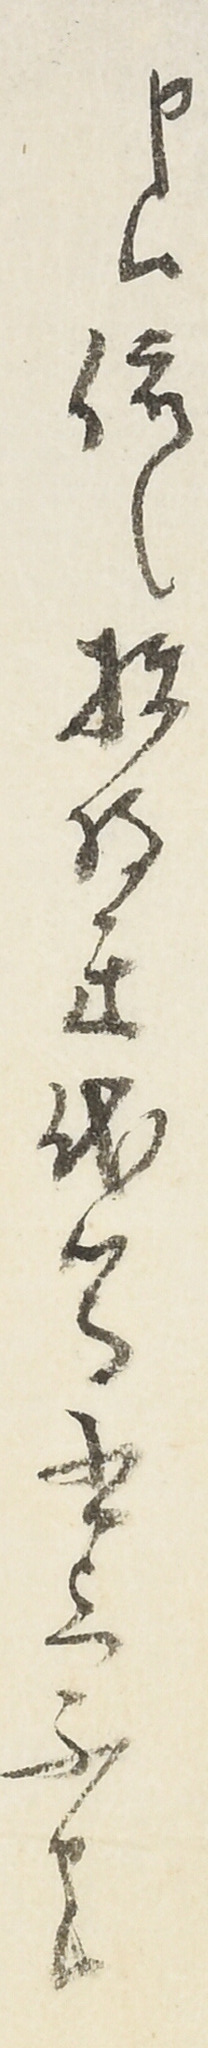申候依之扶持米代等書上不申候
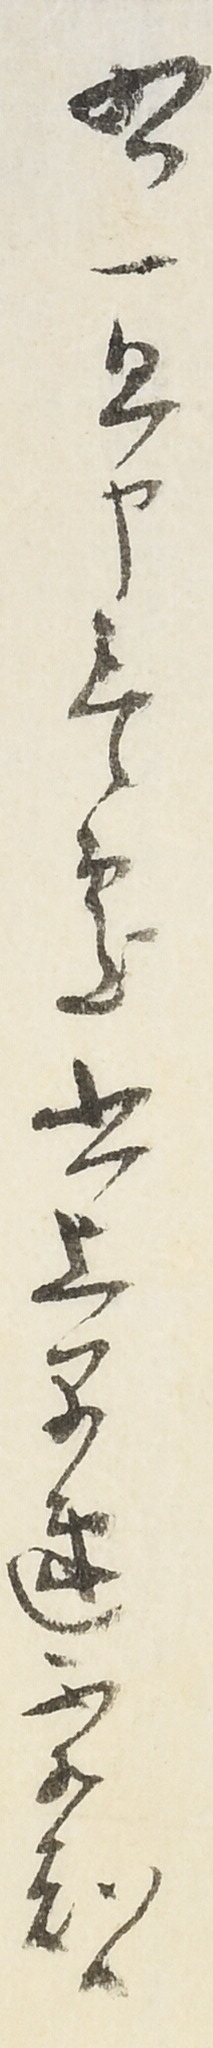右一旦申上候処書上早速不相知候
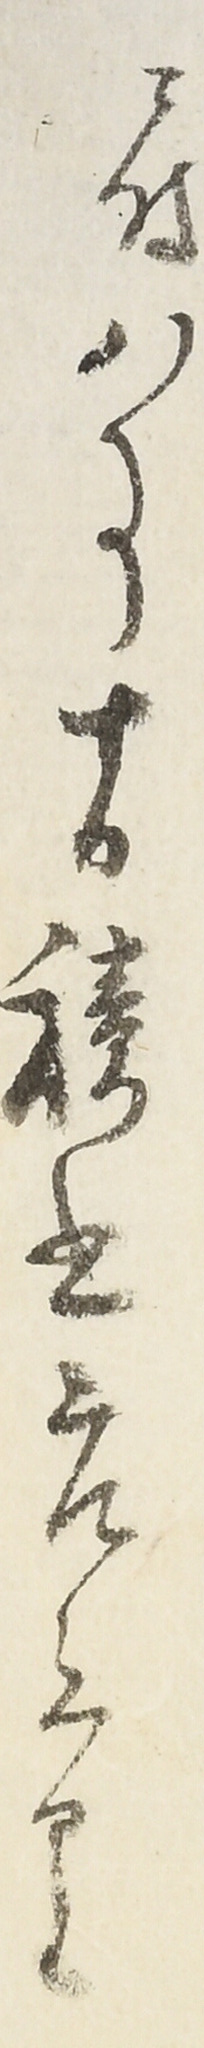ニ付八月十日積書差上申候

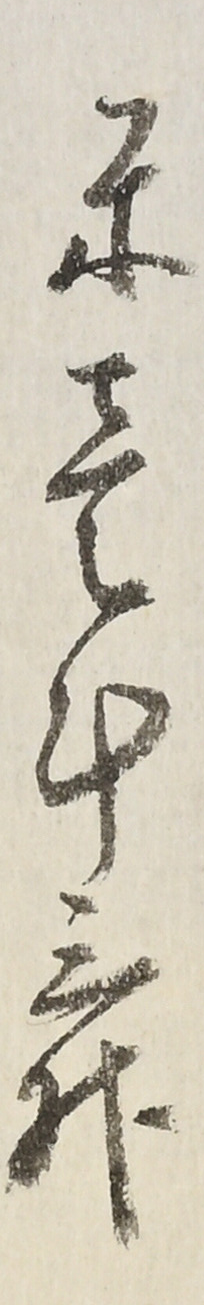米壱斗三升
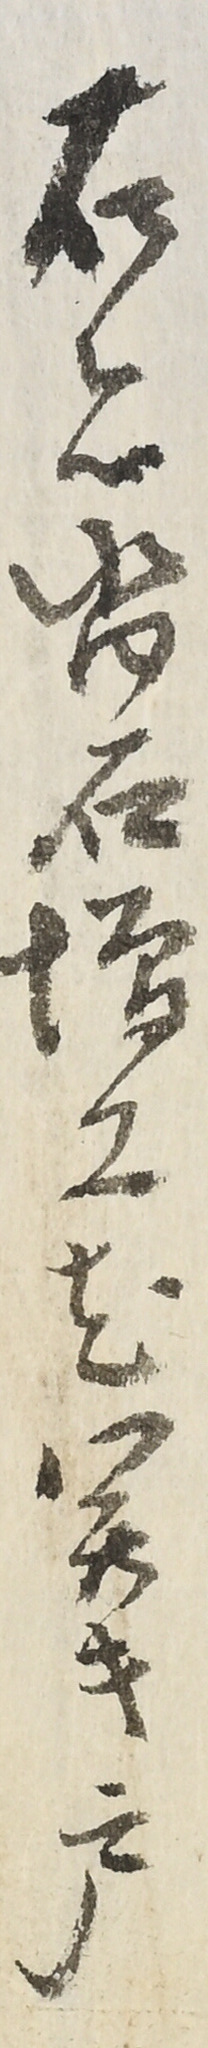右者沓石増工尤開キ戸
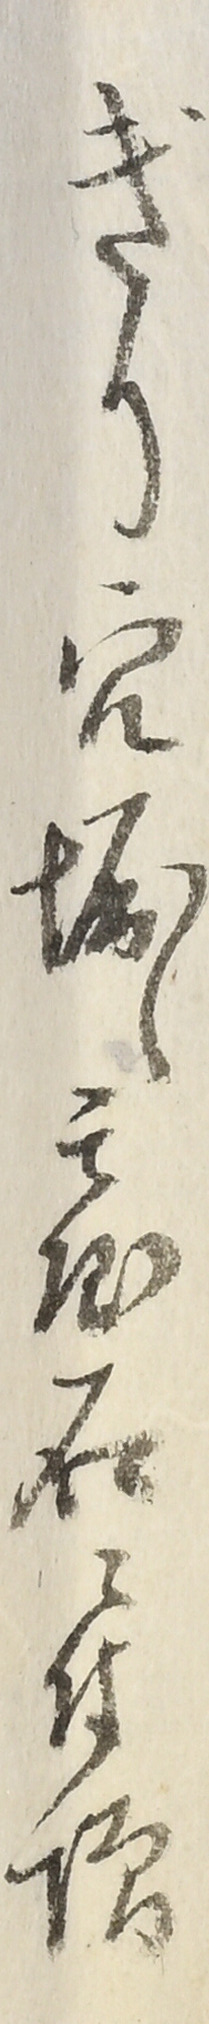ぎり穴堀候台石ニ付増
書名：町方木戸御普請諸事附（一括）
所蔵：伊那市立高遠町図書館・合同会社AMANE
